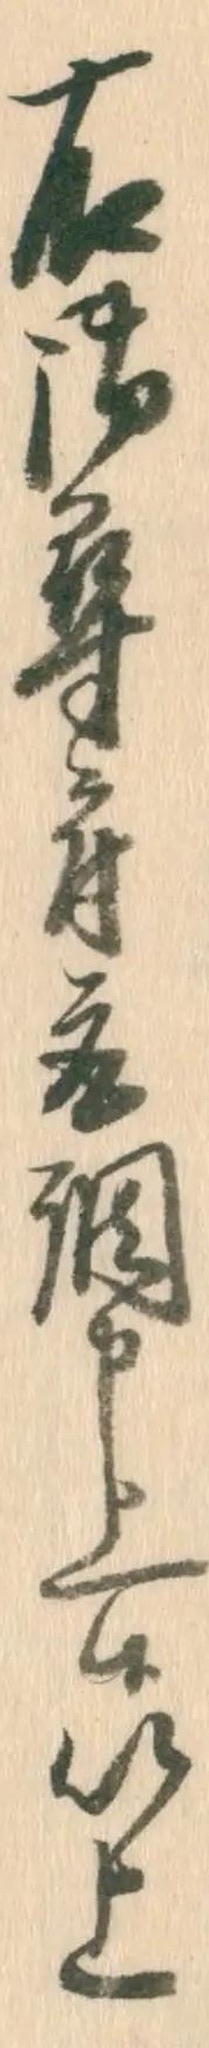右御尋ニ付取調申上候以上
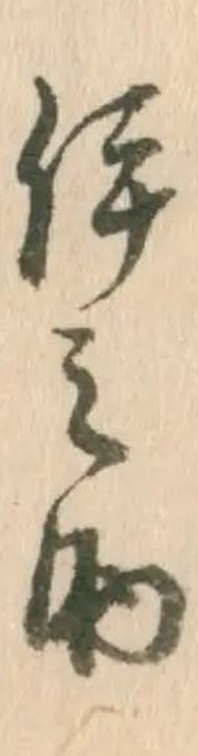伊之助
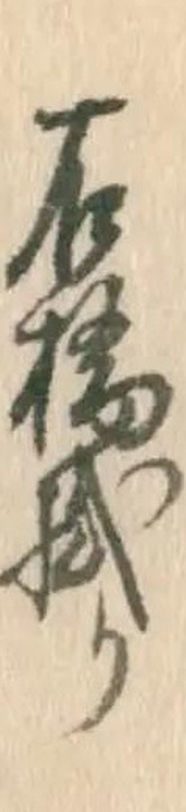右橋掛り
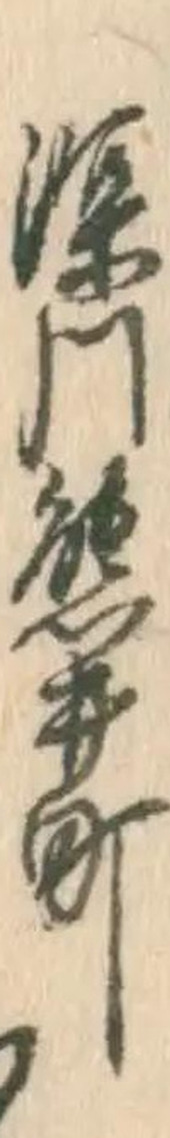深川熊井町
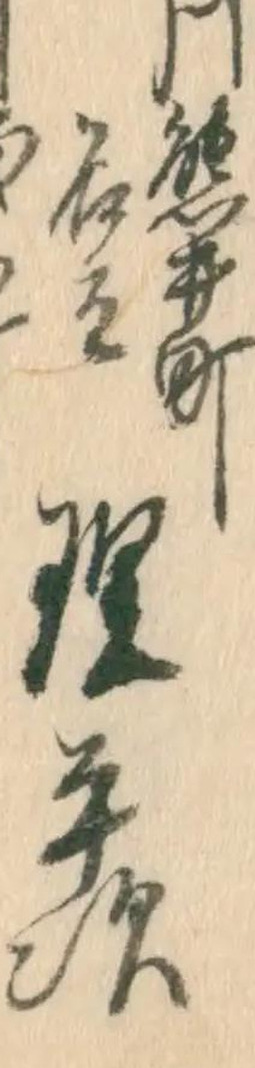名主理平次
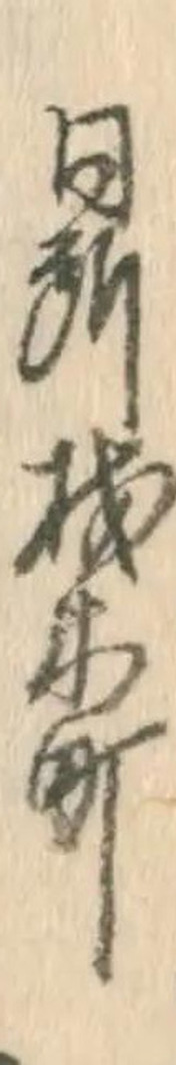同所材木町

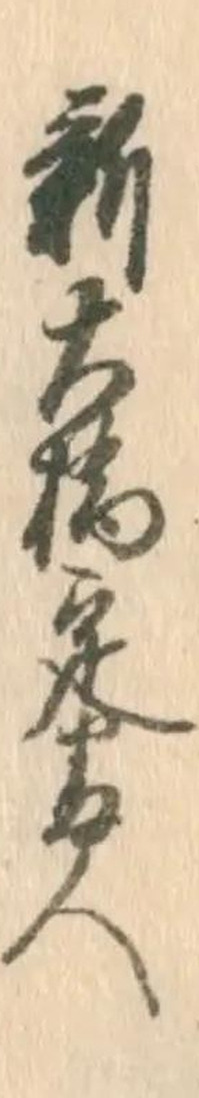新大橋定番人
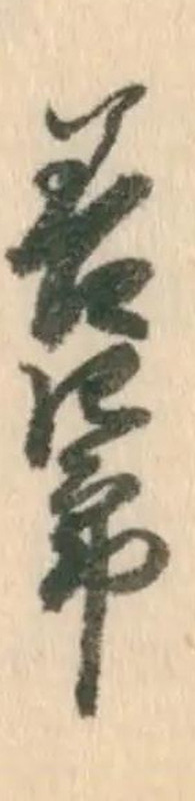善四郎
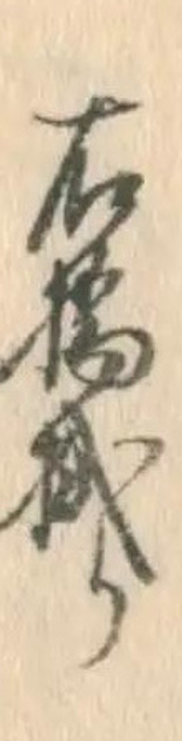右橋掛り
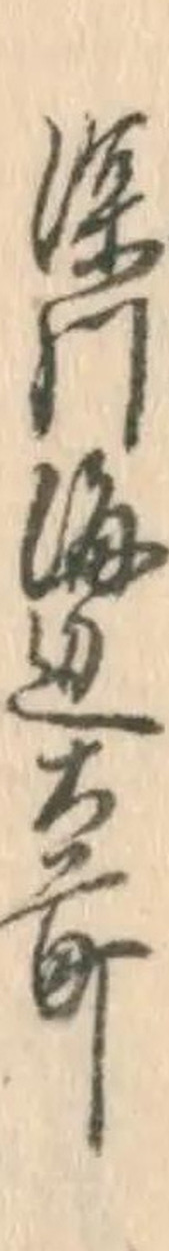深川海辺大工町
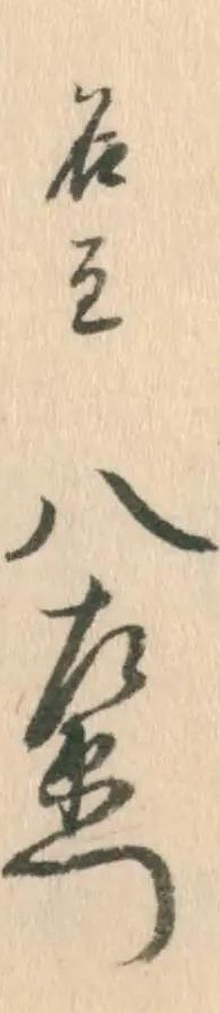名主八左衛門
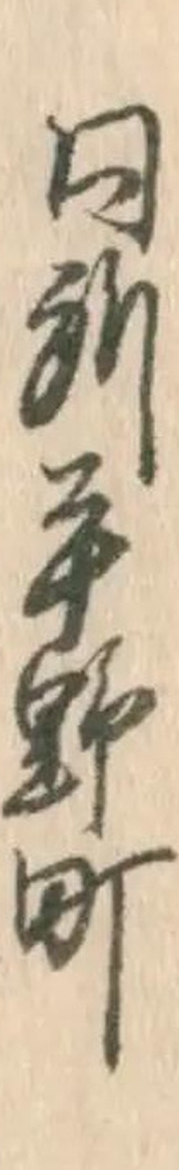同所平野町
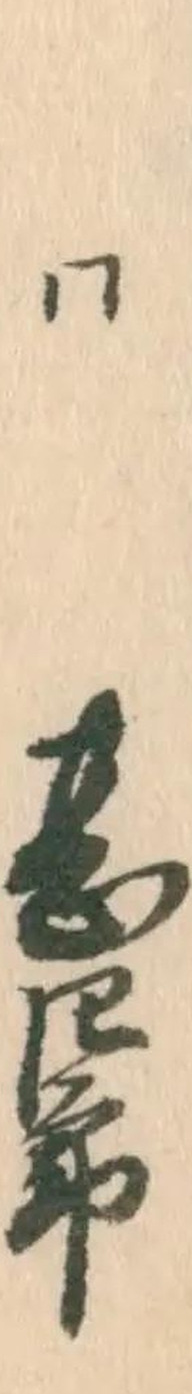同甚四郎
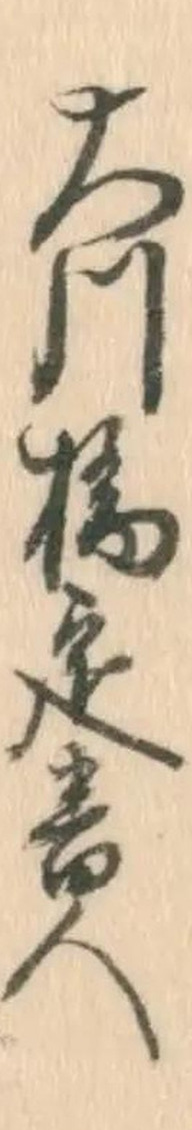大川橋定番人
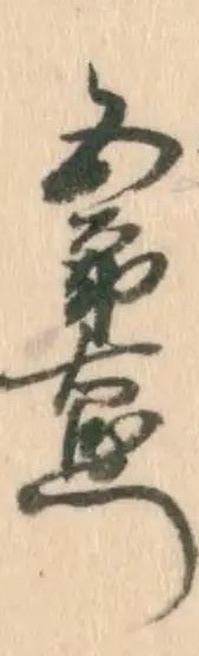五郎右衛門
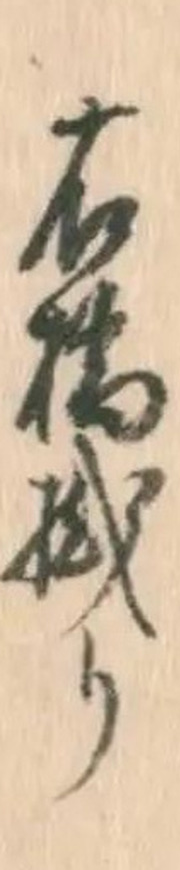右橋掛り
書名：三橋 17巻. [7] 三橋小破御修復書留　但御奉行御掛リ替地震潰橋番屋　嘉永四亥年より安政二卯年迄　上
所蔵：国立国会図書館 National Diet Library, JAPAN
